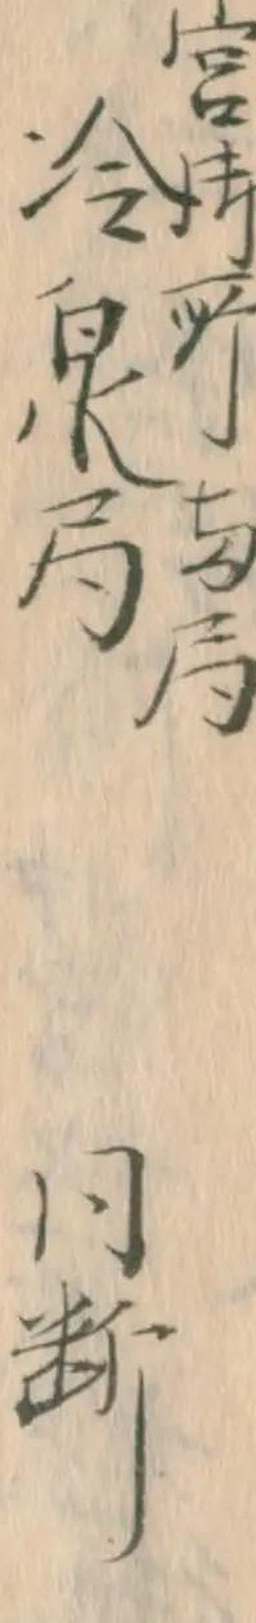高辻局同断
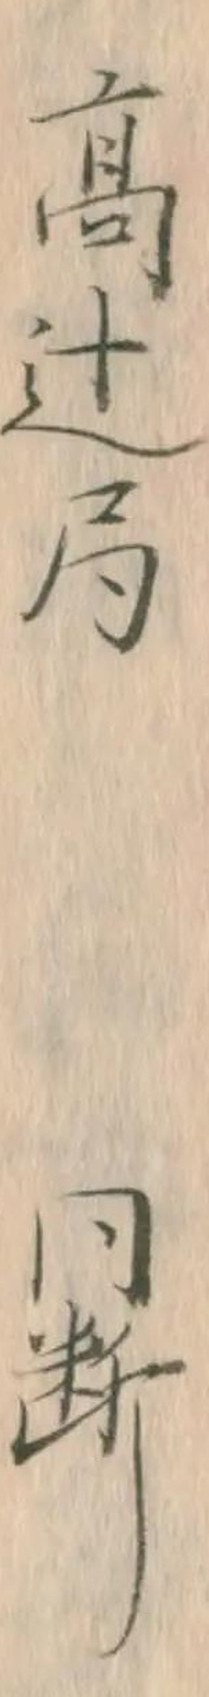高辻局同断
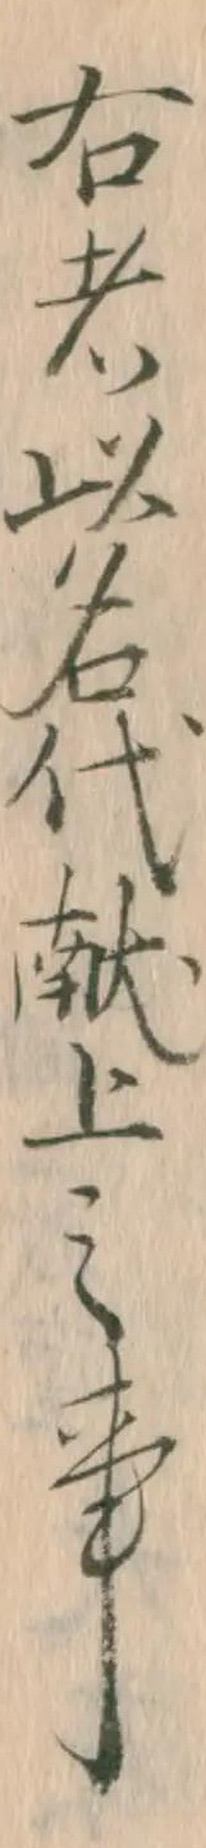右は以名代献上之事
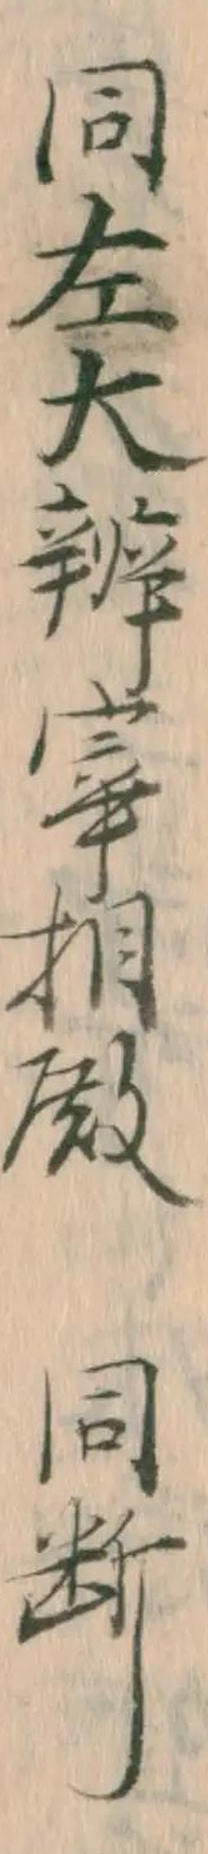同左大辨宰相殿同断
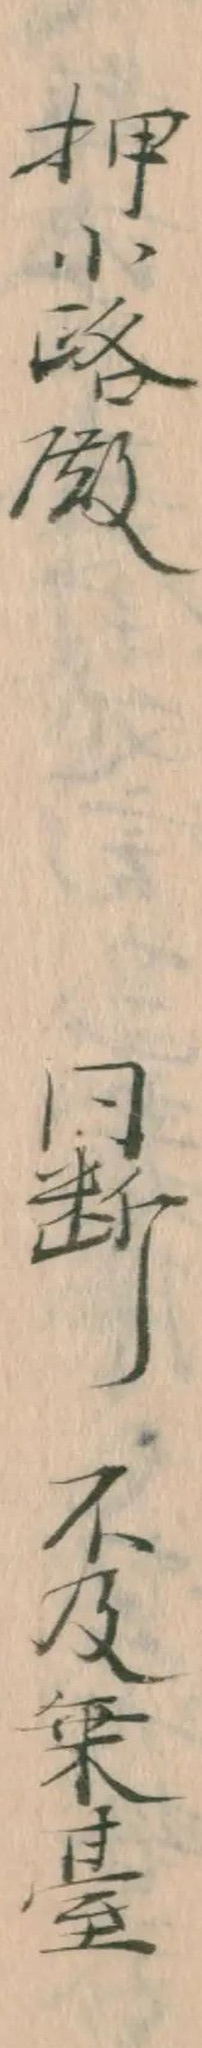押小路殿同断不及乗臺
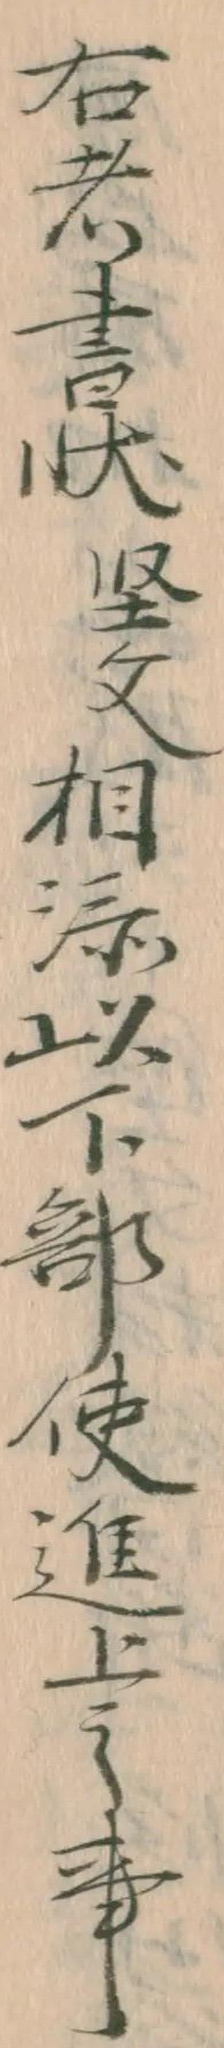右者書状堅文相添以下部使進上之事
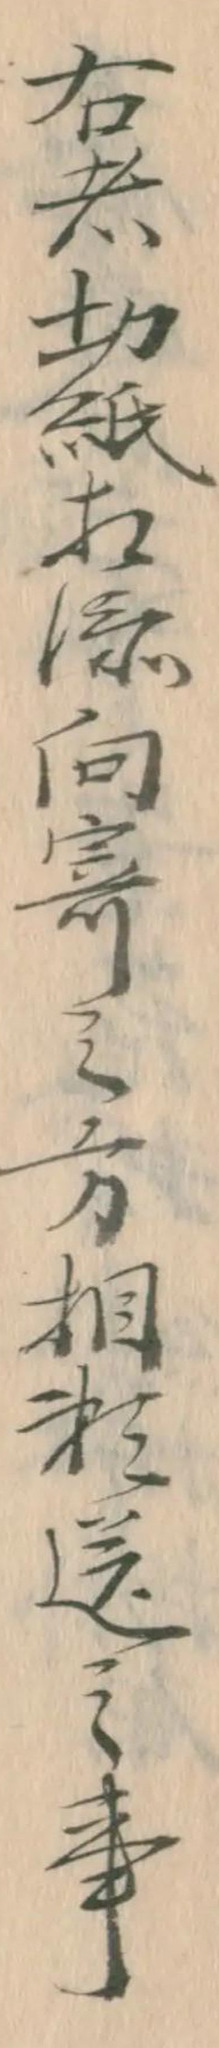右は切紙相添向寄之方相頼送之事

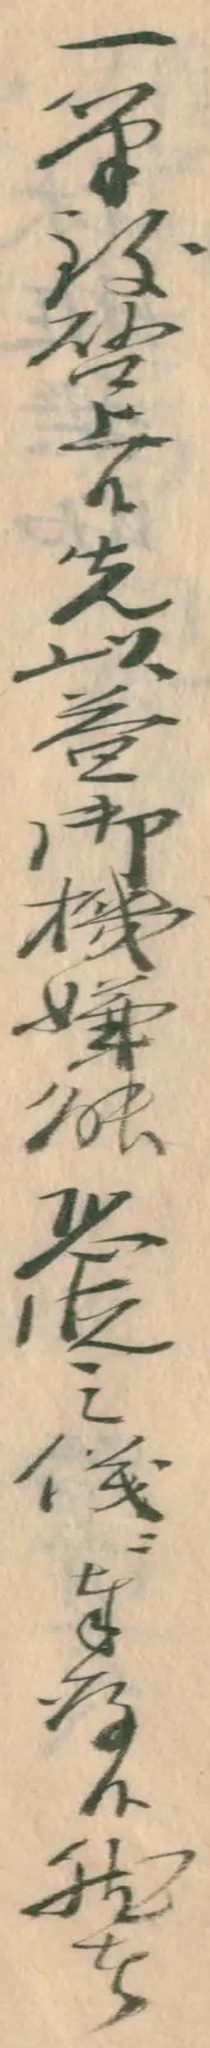一筆致啓上候先以益御機嫌能恐悦之儀に奉存候然は
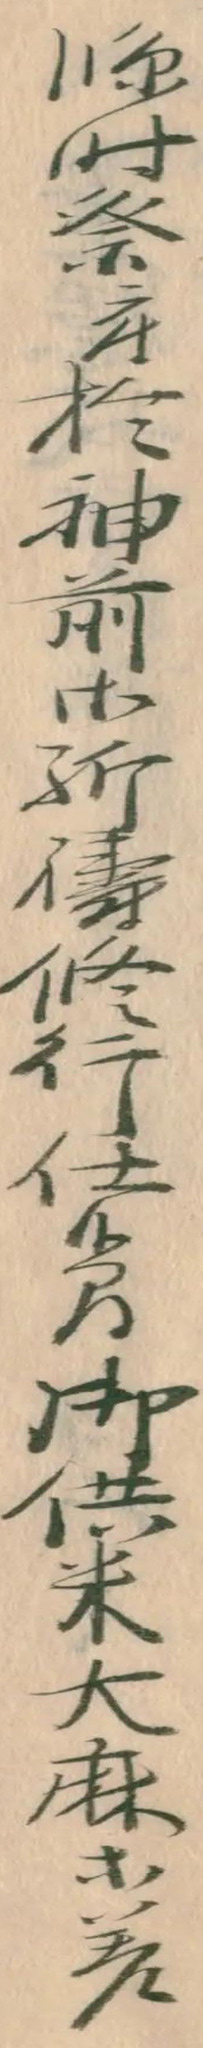臨時祭ニ付於神前御祈祷修行仕候間御供米大麻等差
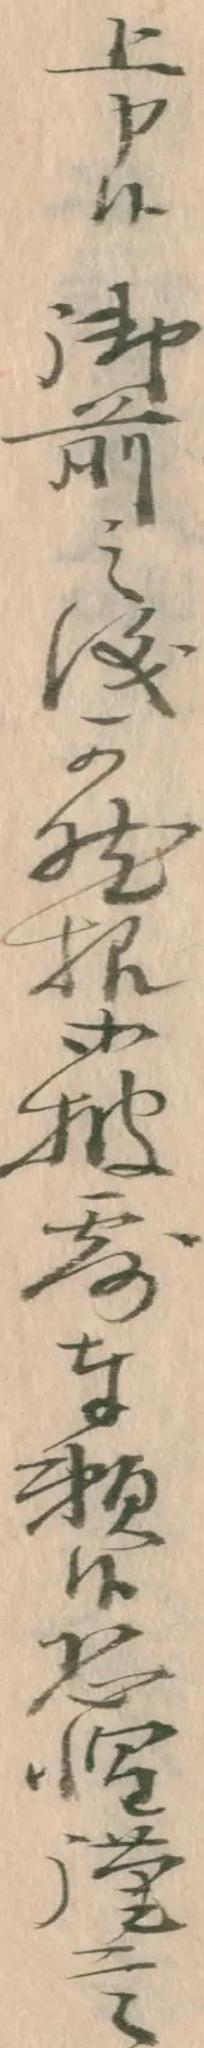上申候御前之儀可然様御披露奉頼候恐惶謹言
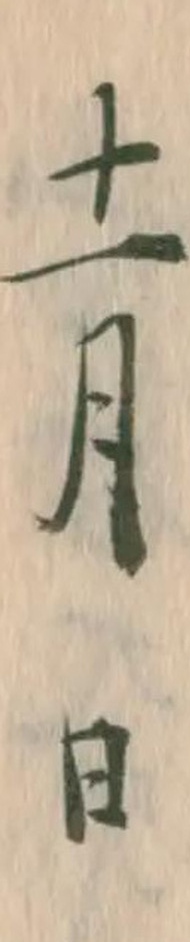十一月日
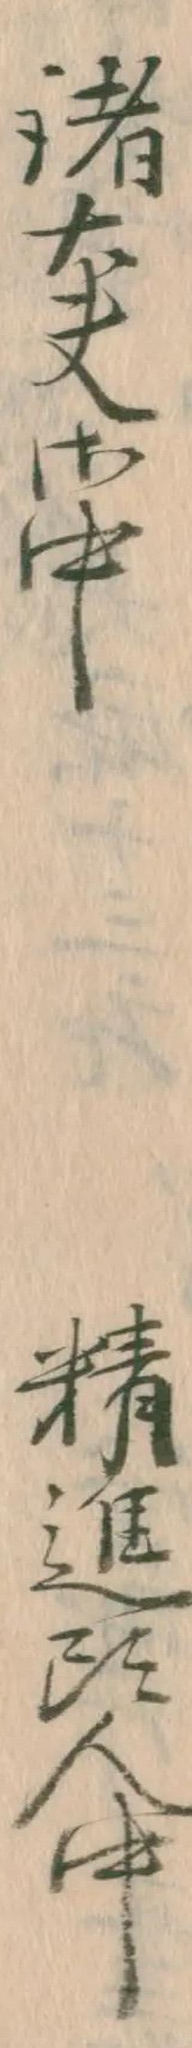諸大夫御中精進頭人中
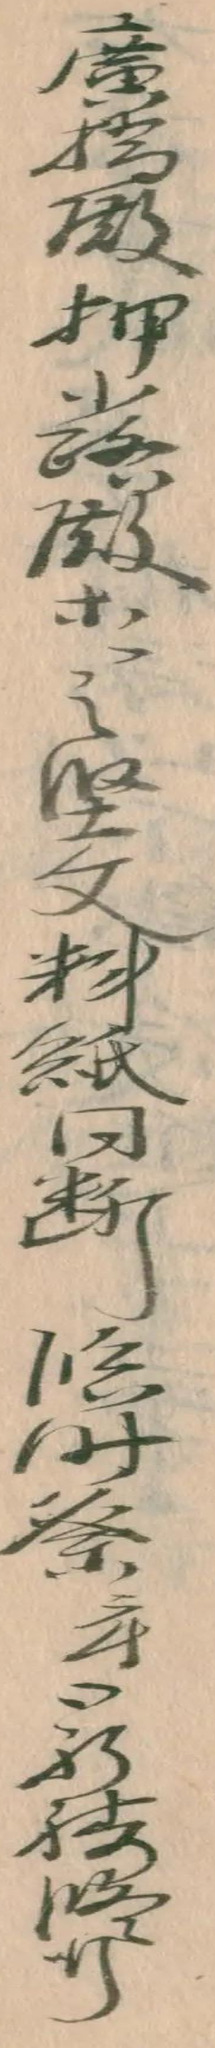廣橋殿押小路殿等へ之堅文料紙同断臨時祭ニ付御祈祷修行
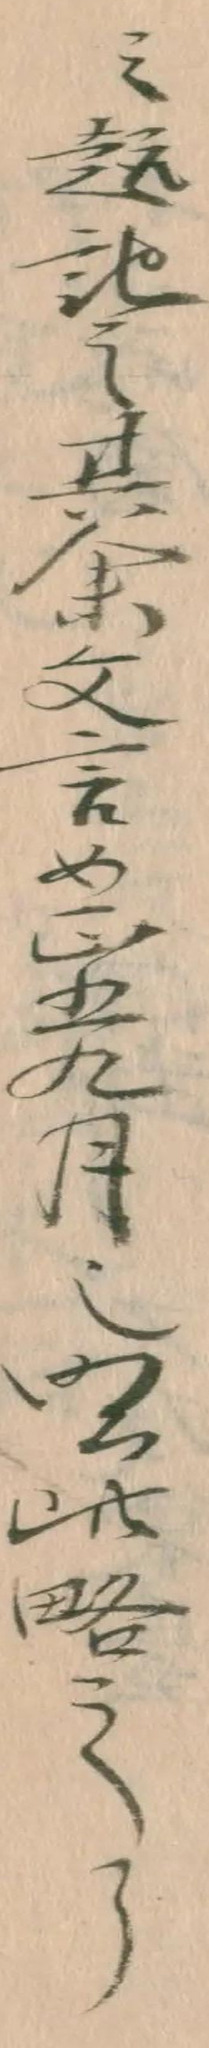之趣記之其余文言如正五九月也仍而此略之了
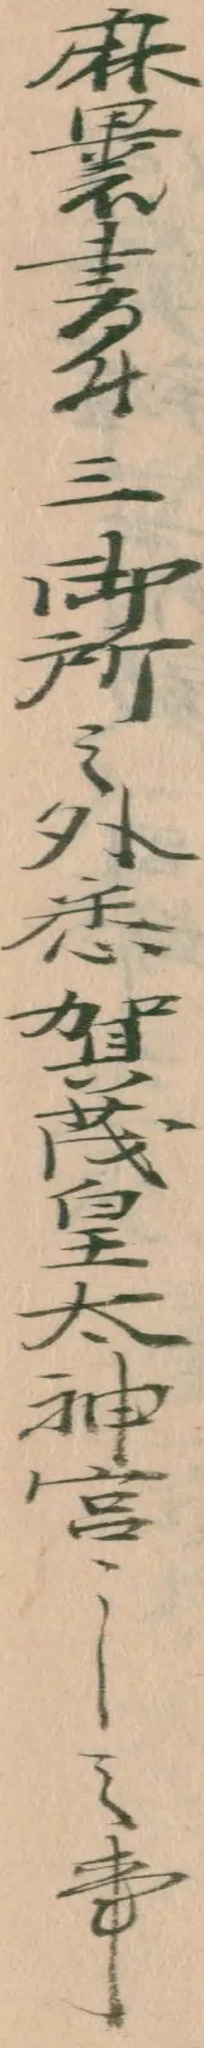麻褁書付三御所之外悉賀茂皇太神宮ーー之事
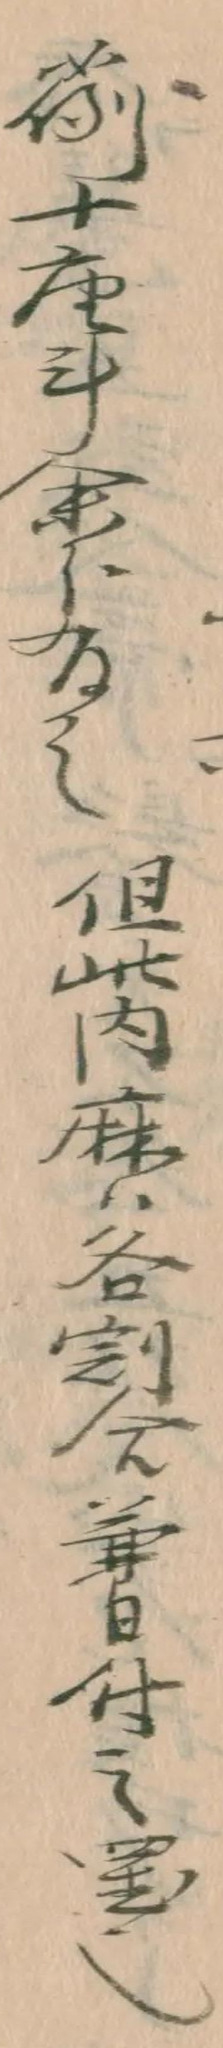如例十座斗余分有之但此内麻ハ各割合兼日付之置也
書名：賀茂社記録. 第74冊
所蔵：国立国会図書館 National Diet Library, JAPAN
